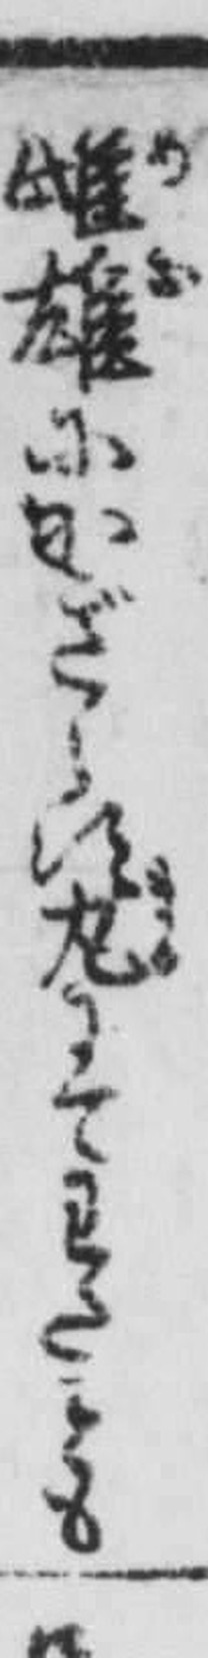雌雄にかぎらす丸にてわたとも
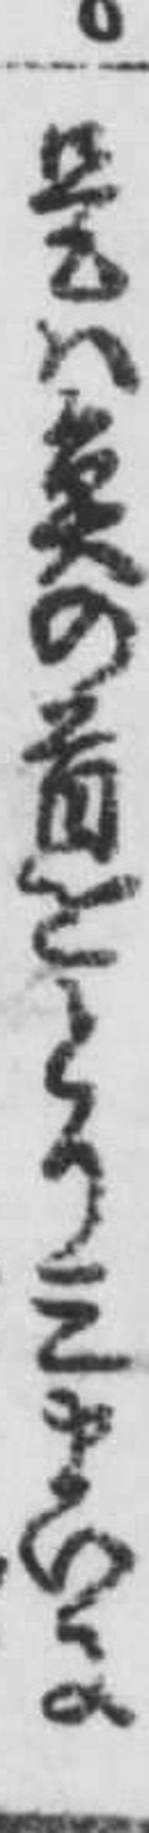是は魚の首をとり三まいに
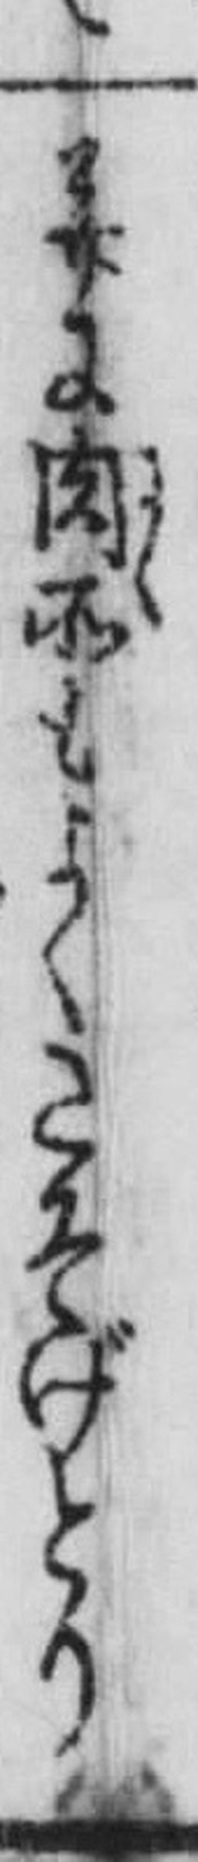并に肉所もよくこそげとり
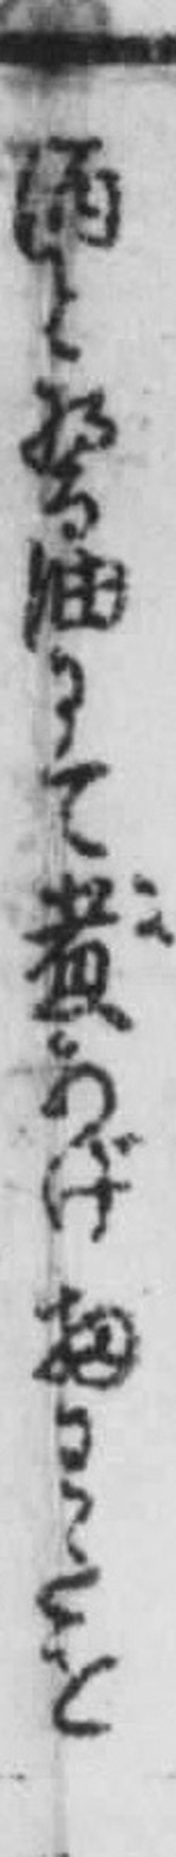酒と醤油にて煮あげ扨わたを
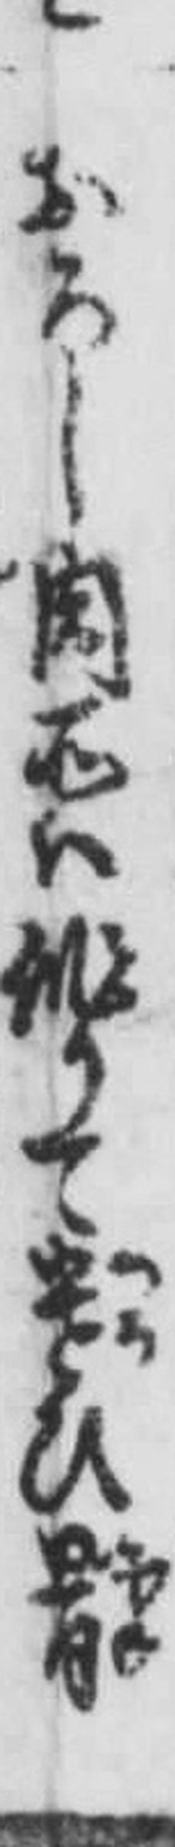おろし肉所は作て遣ひ骨
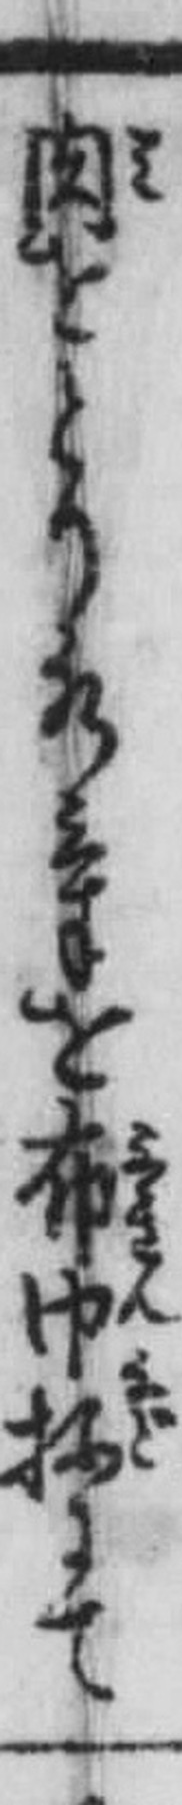肉をとり水気を布巾抔にて
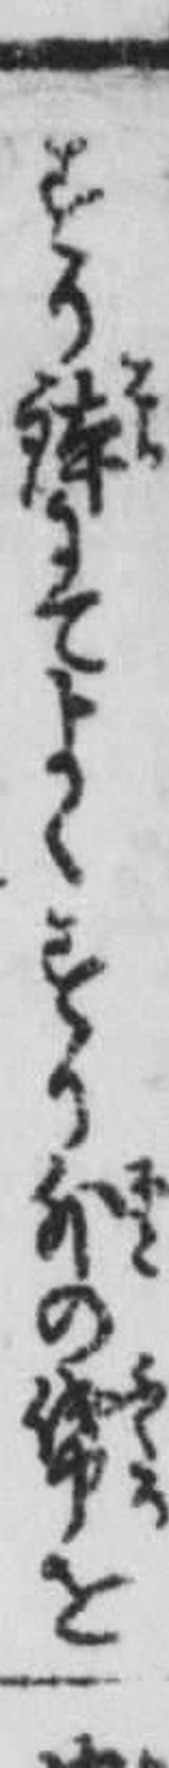すり鉢にてよくすり外の袋を
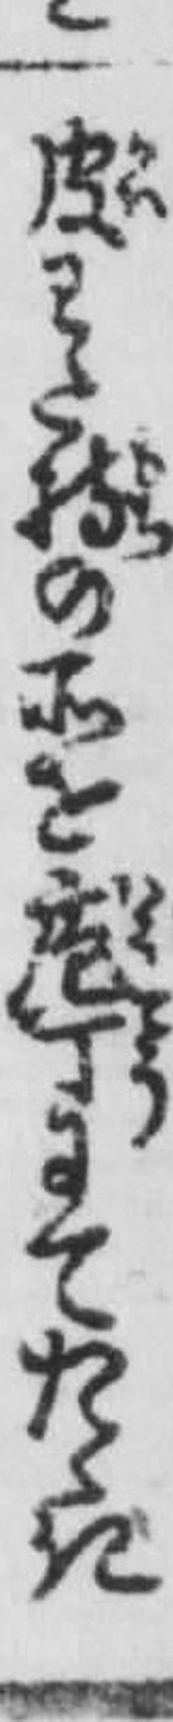皮わた持の所を庖丁にてたゝき
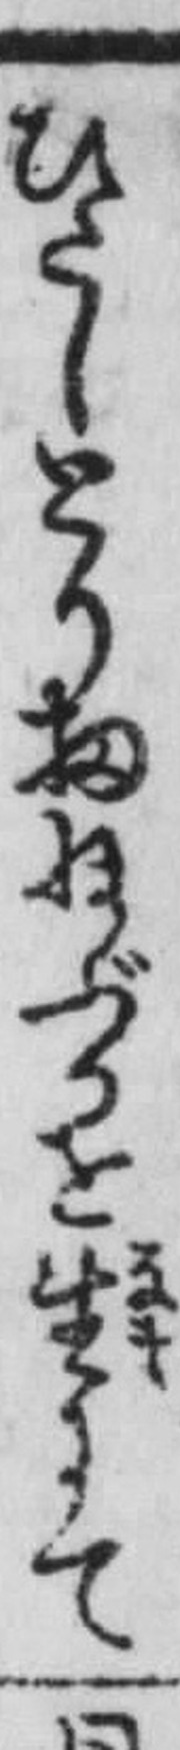ひたしとり扨ねぶかを生にて
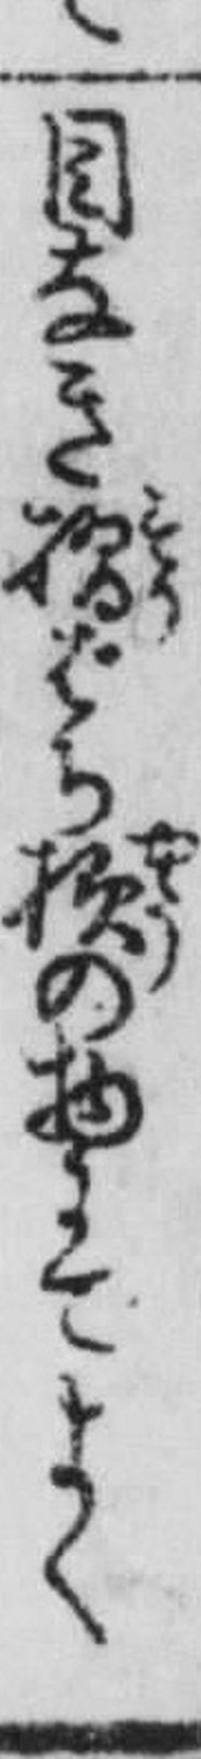目なき擂ばち様の物にてよく
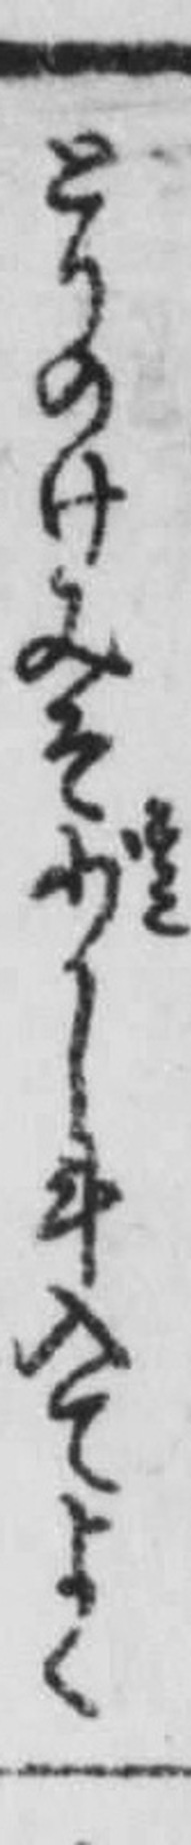とりのけみそ少し斗入てよく
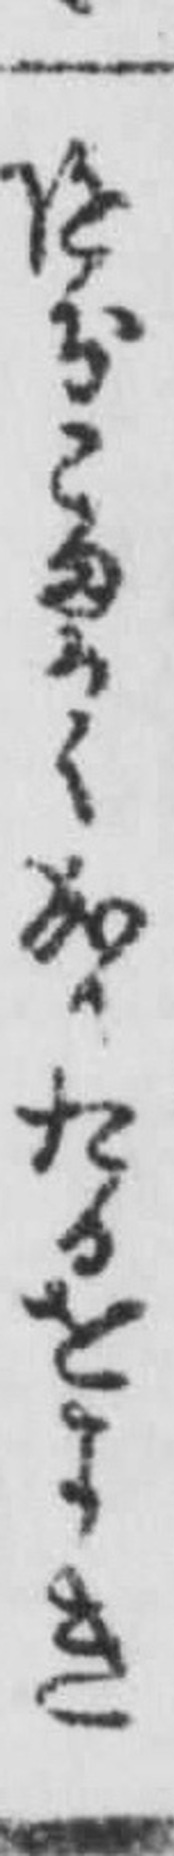随分こまかく成りたるをよき
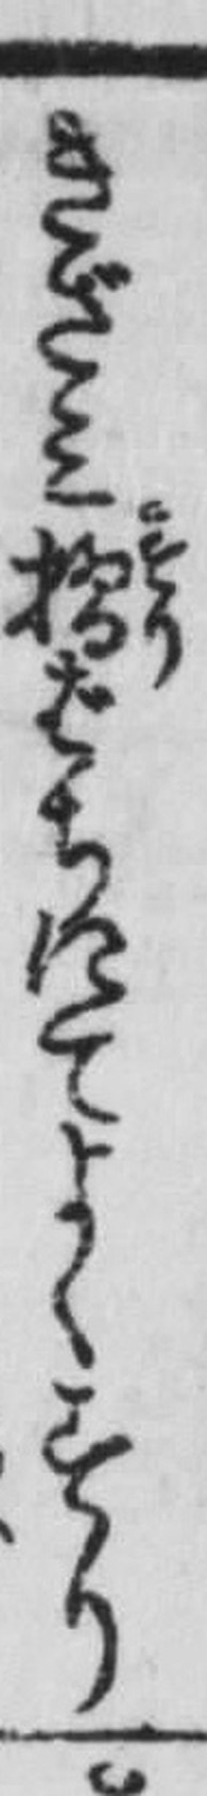きざみ擂ばちにてよくすり
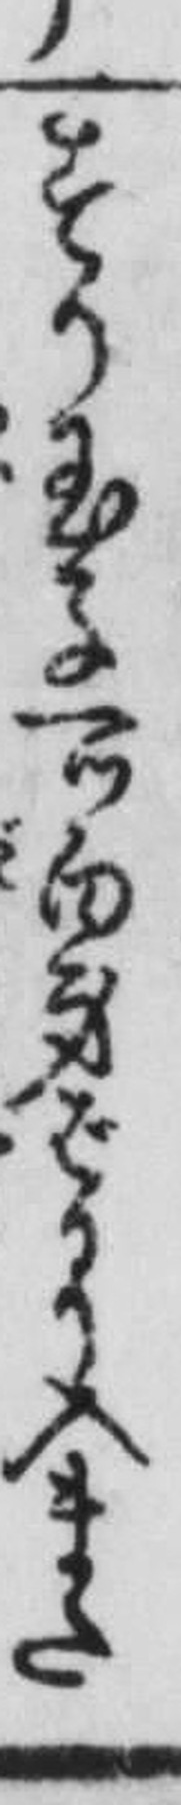すり玉子一つ白身ばかり入また
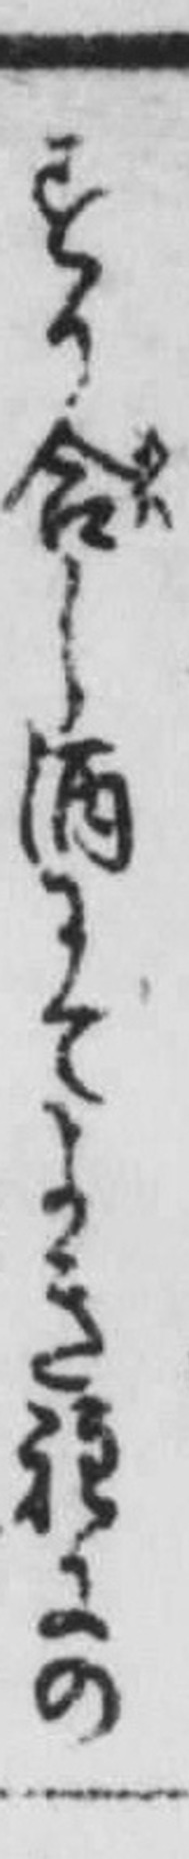すり合し酒にてよき程にの
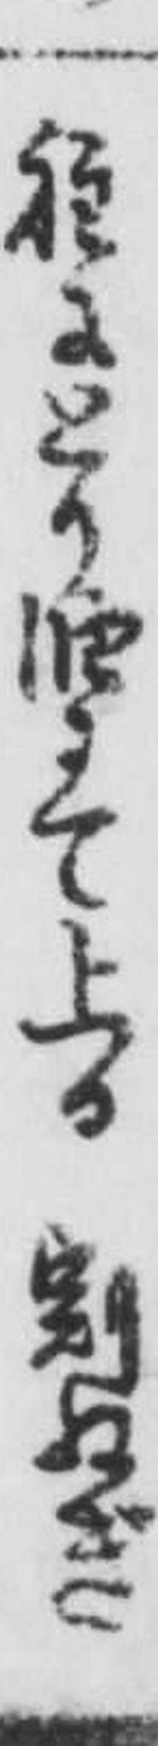程にとり油にて上る割ねぎ
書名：精進魚類間合料理/早速庖丁
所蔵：大阪府立大学学術情報センター 国文学研究資料館
